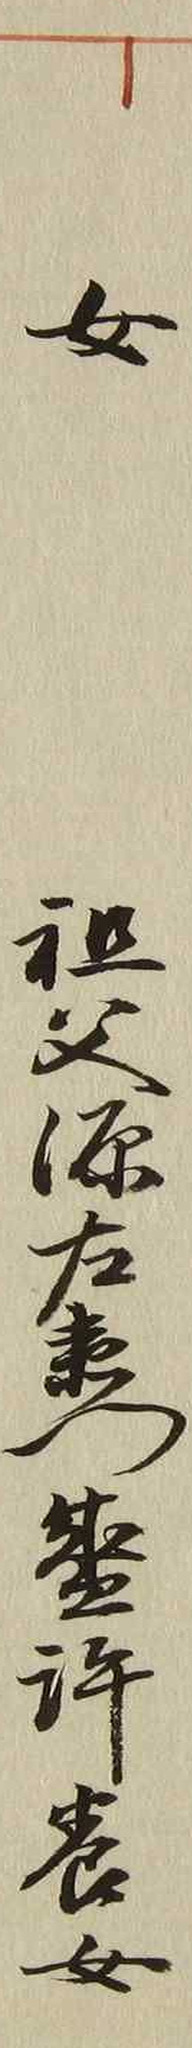女祖父源左衛門盛許養女
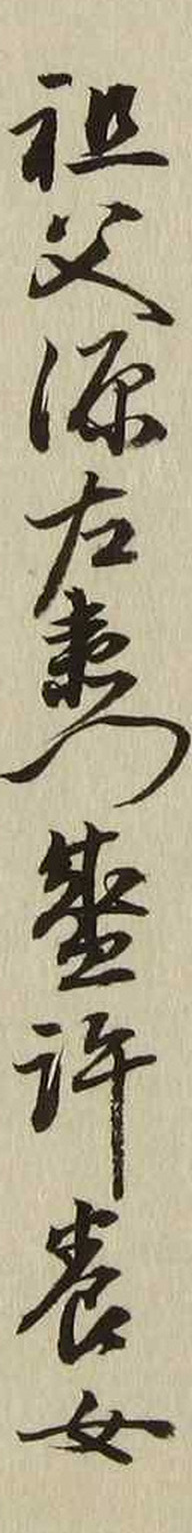女祖父源左衛門盛許養女
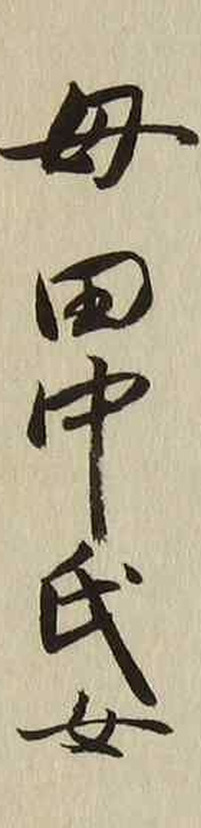母田中氏女
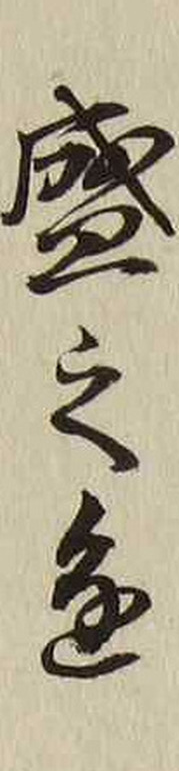盛之進
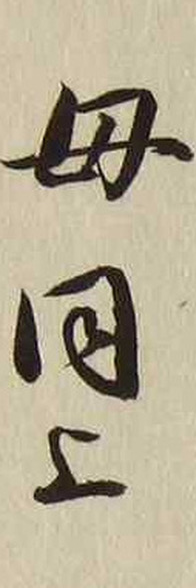母同上
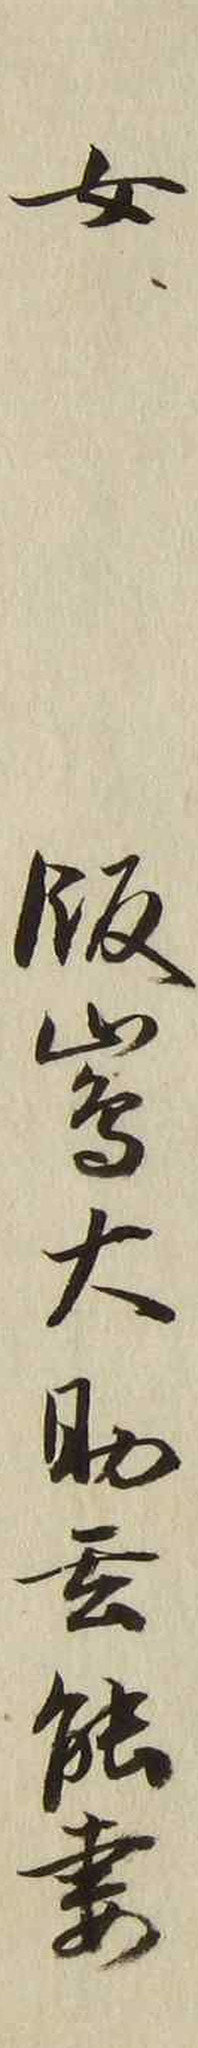女飯嶌大助玄能妻
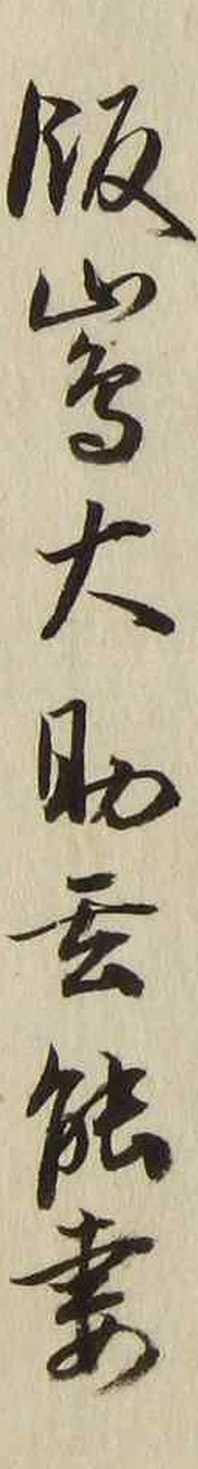女飯嶌大助玄能妻

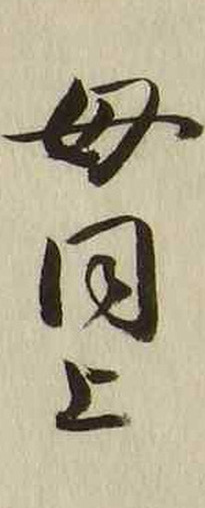母同上
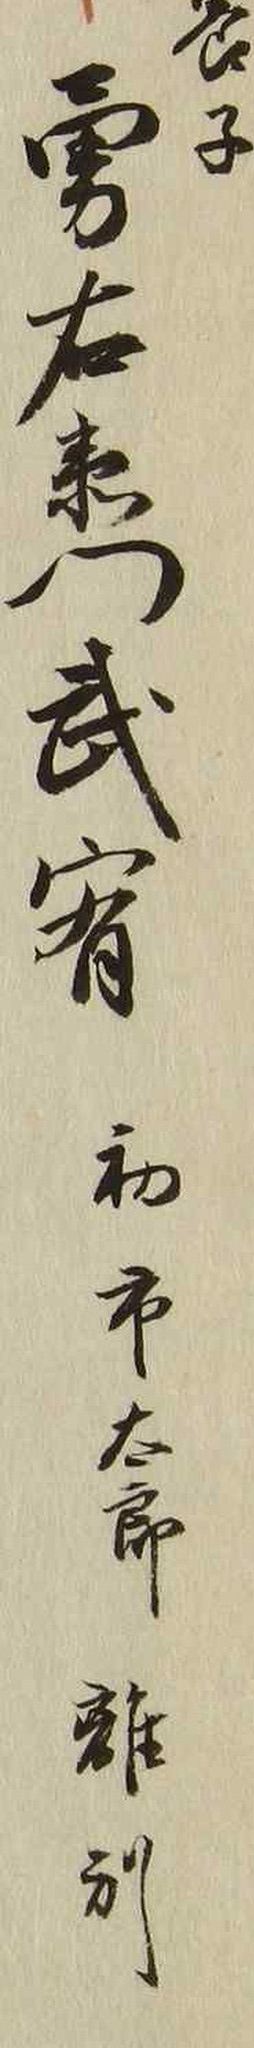勇右衛門武宥初市太郎離別
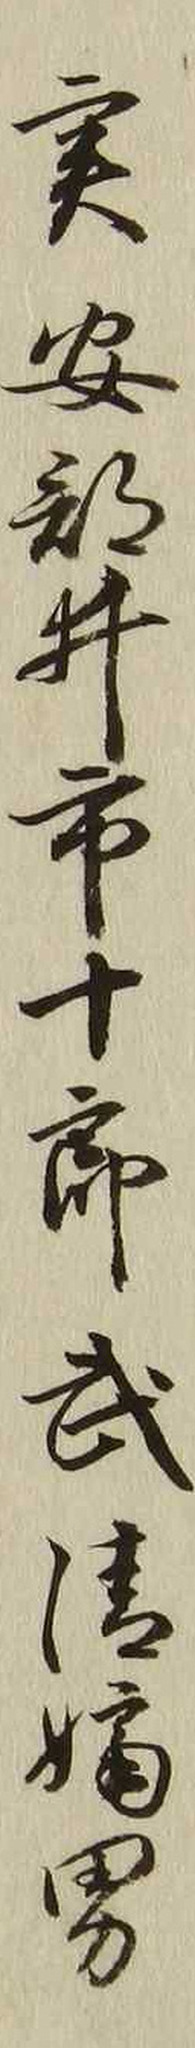実安部井市十郎武清嫡男
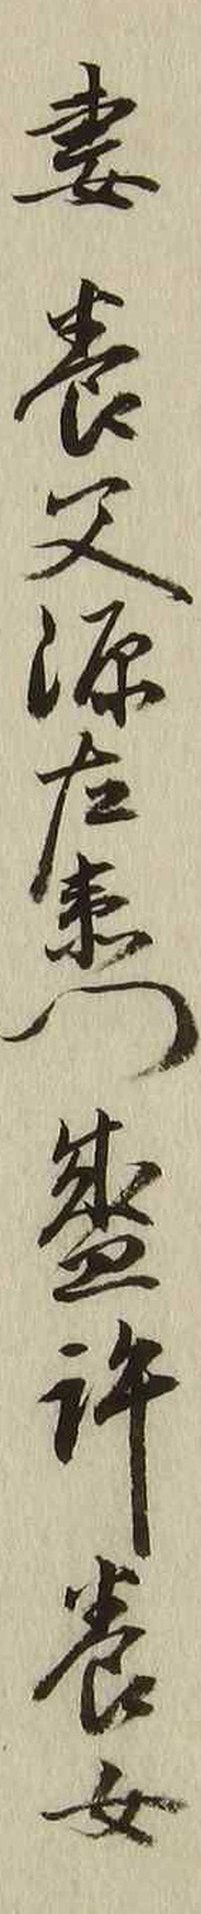妻養父源左衛門盛許養女
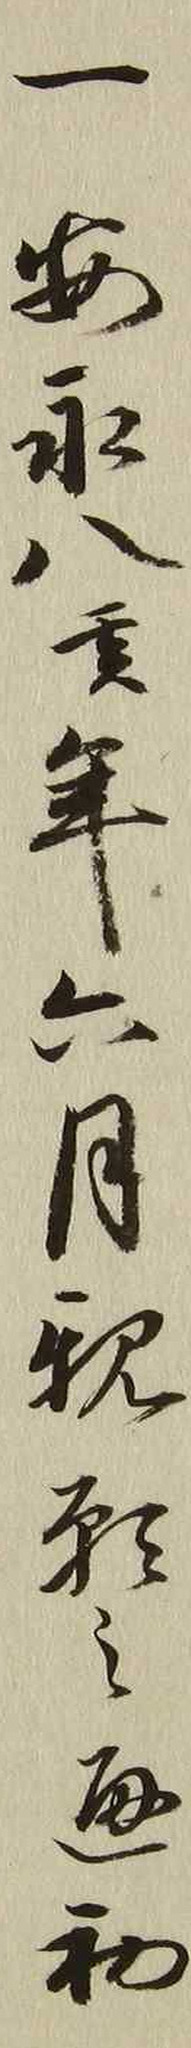一安永八亥年六月親願之通初
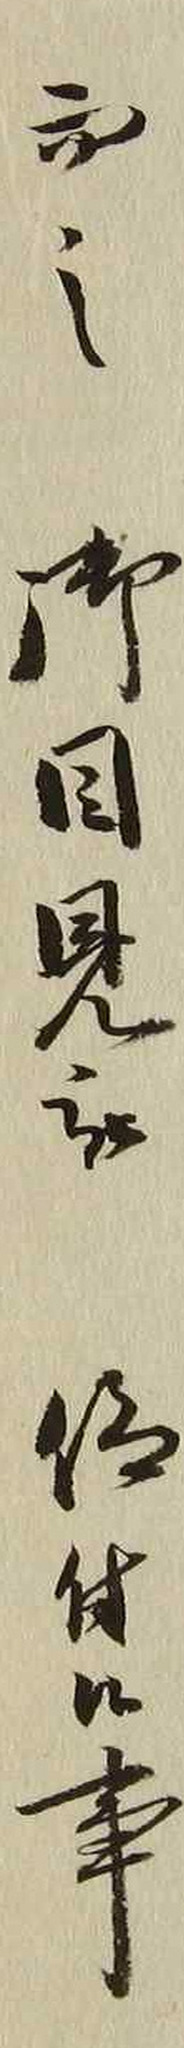而之御目見被仰付候事
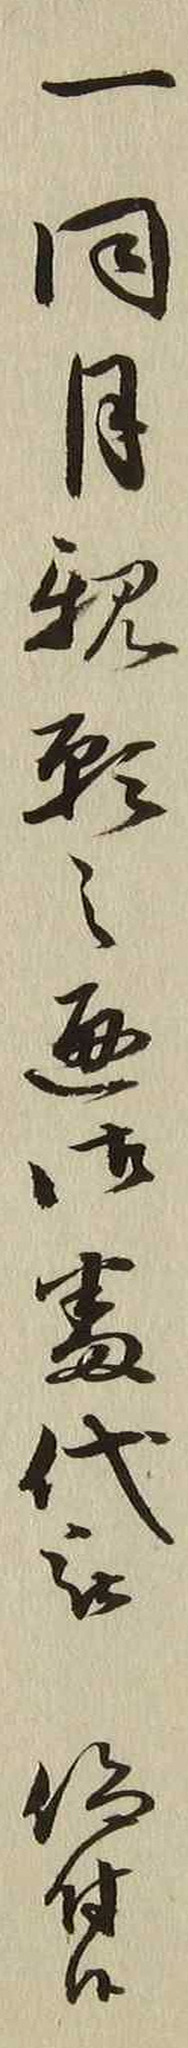一同月親願之通御番代被仰付候
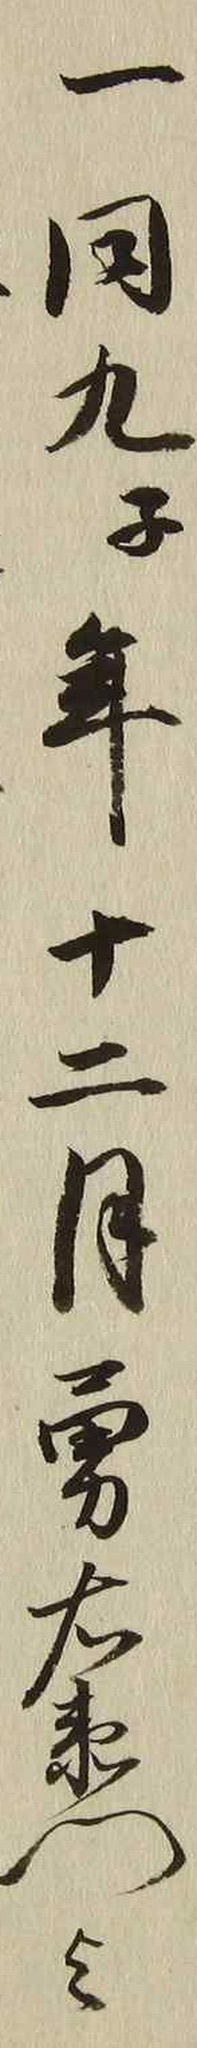一同九子年十二月勇右衛門与
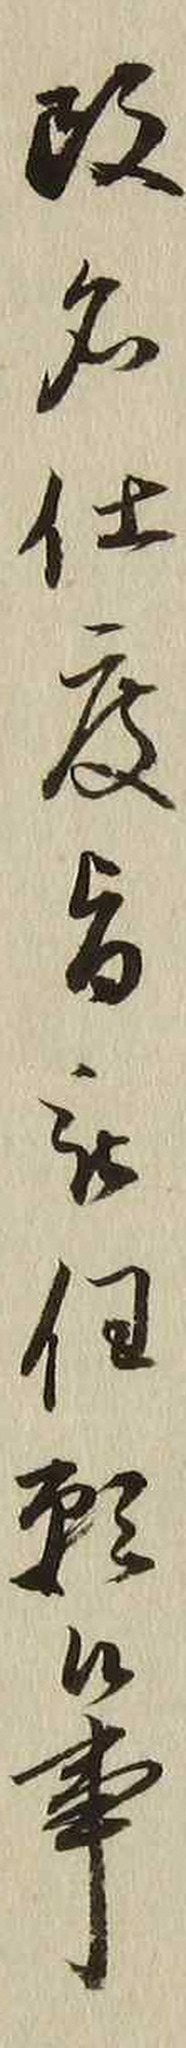改名仕度旨被任願候事
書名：諸士系譜　巻之61　と之部4
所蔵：会津若松市立会津図書館
